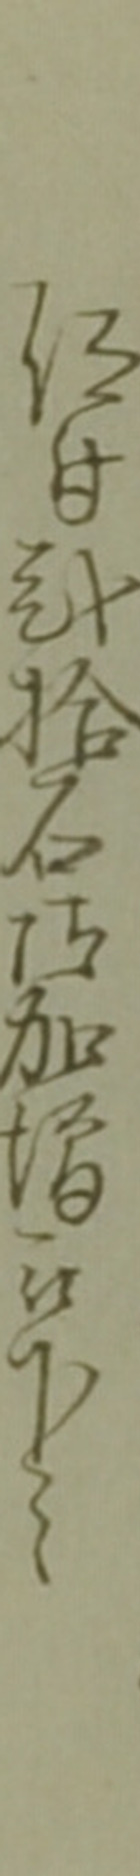仰付弐拾石御加増被下之
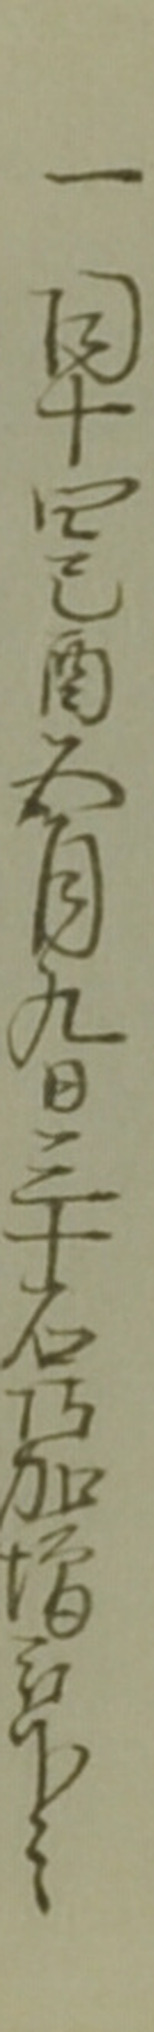一同十四己酉五月九日三十石御加増被下之
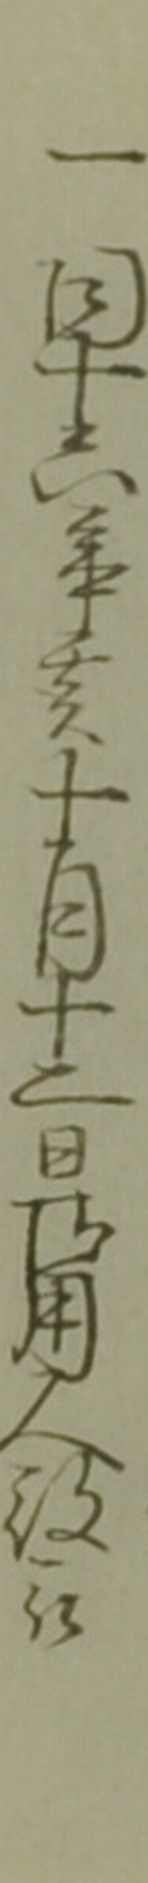一同十六辛亥十月十二日御用人役被
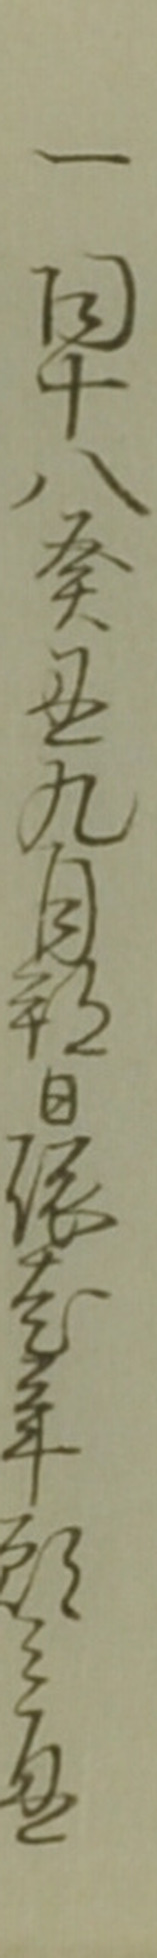一同十八癸丑九月朔日依老年願之通
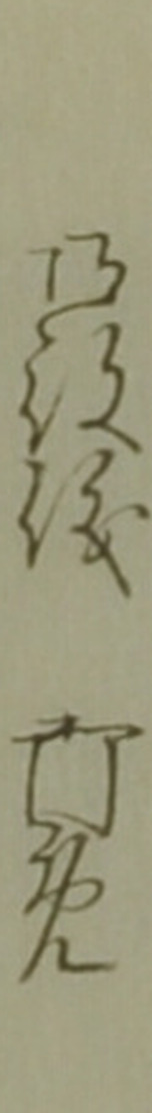御役儀御免
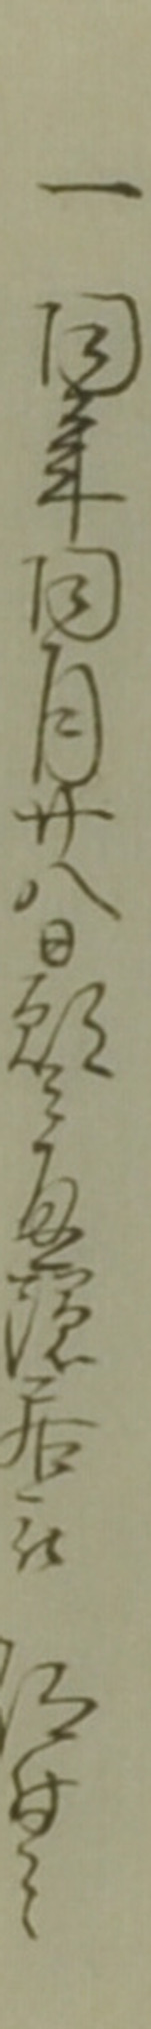一同年同月廿八日願之通隠居被仰付之
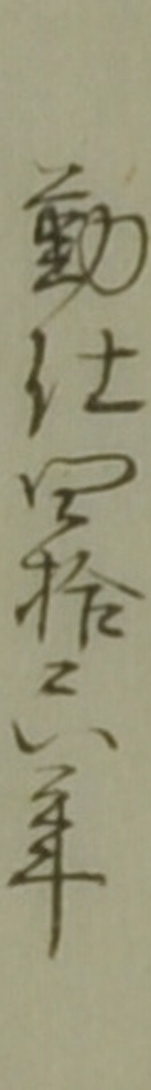勤仕四拾六年
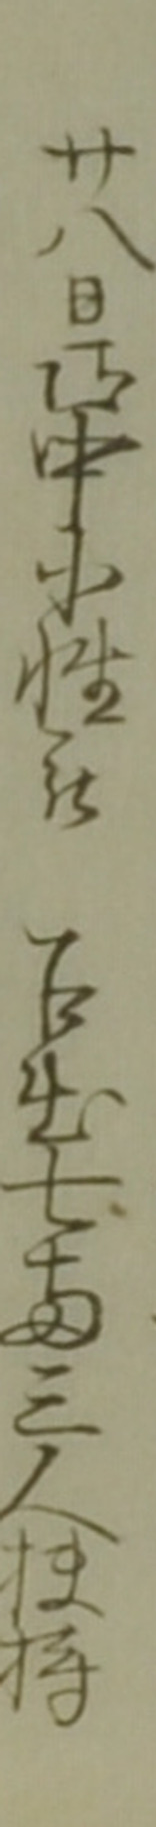廿八日御中小性被召出七両三人扶持
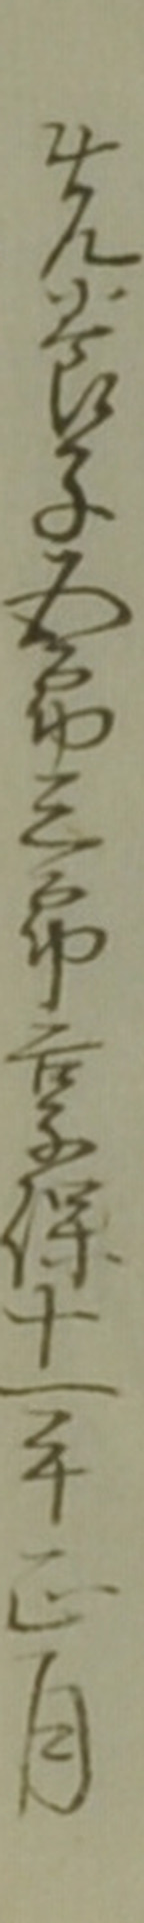先養子五郎三郎享保十一午正月
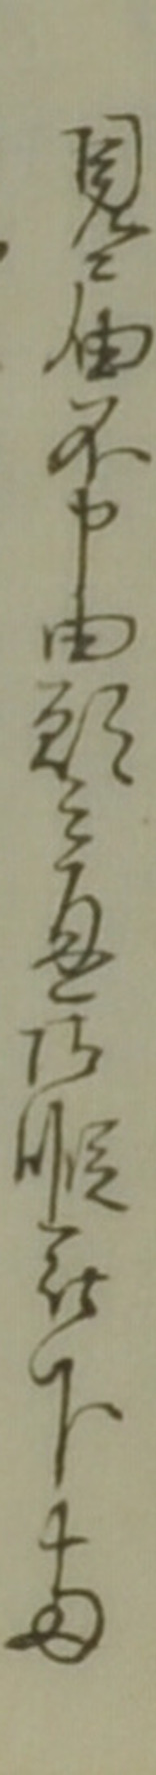見届不申由願之通御暇被下両
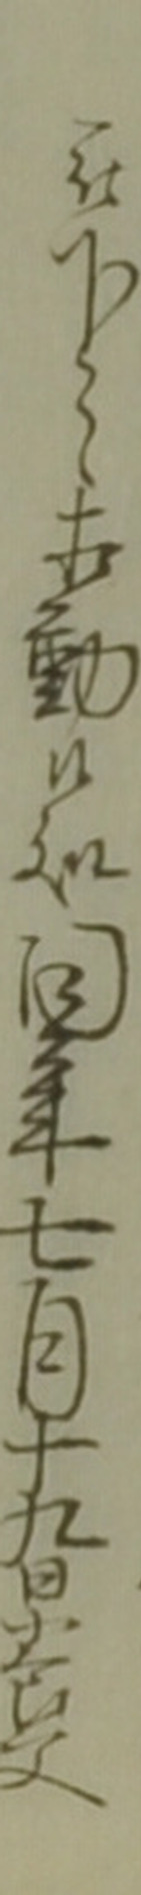被下之相勤候処同年七月十九日養父
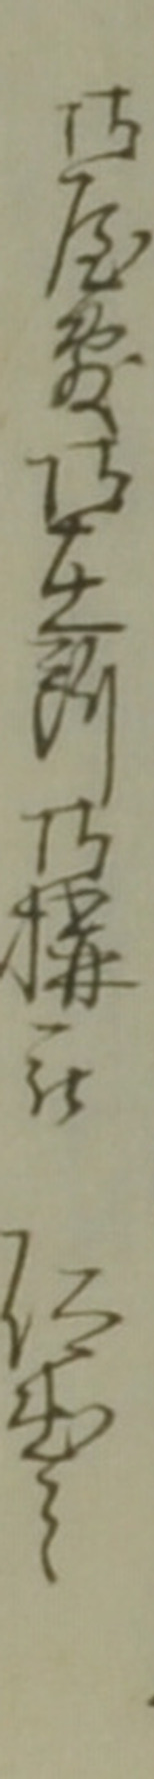御屋敷御在所御構被仰出之
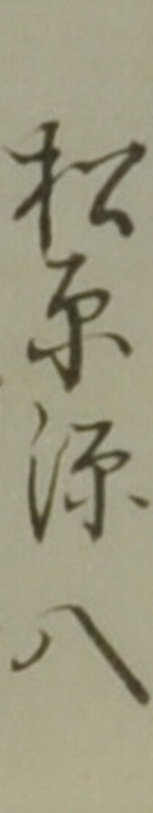松原源八
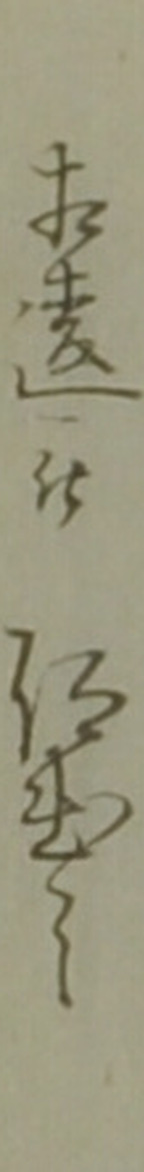相違被仰出之
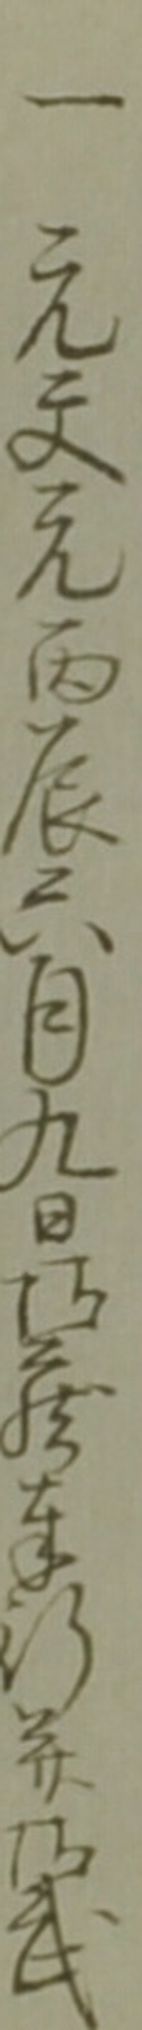一元文元丙辰六月九日御蔵奉行并御武
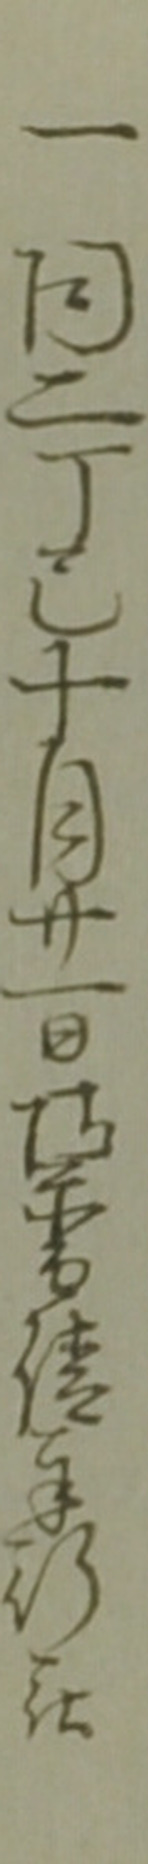一同二丁巳十月廿一日御普請奉行被
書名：給人諸士勤仕録（三）
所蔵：伊那市立高遠町図書館・合同会社AMANE
